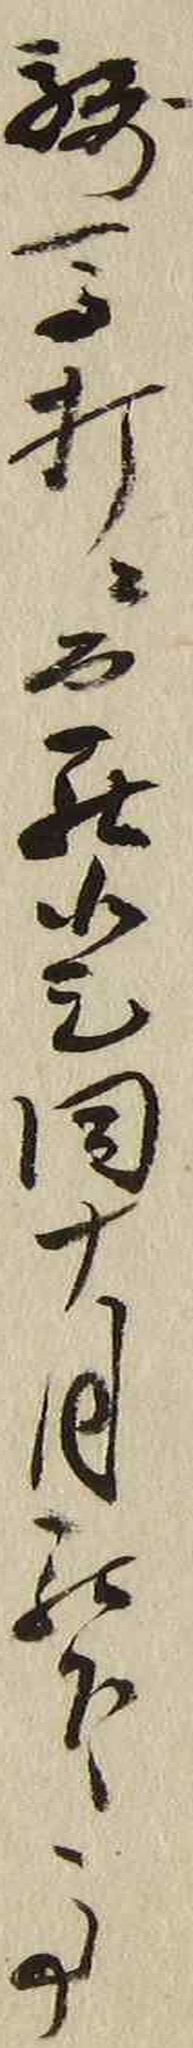騎馬打ニ而罷登同十月罷下候事
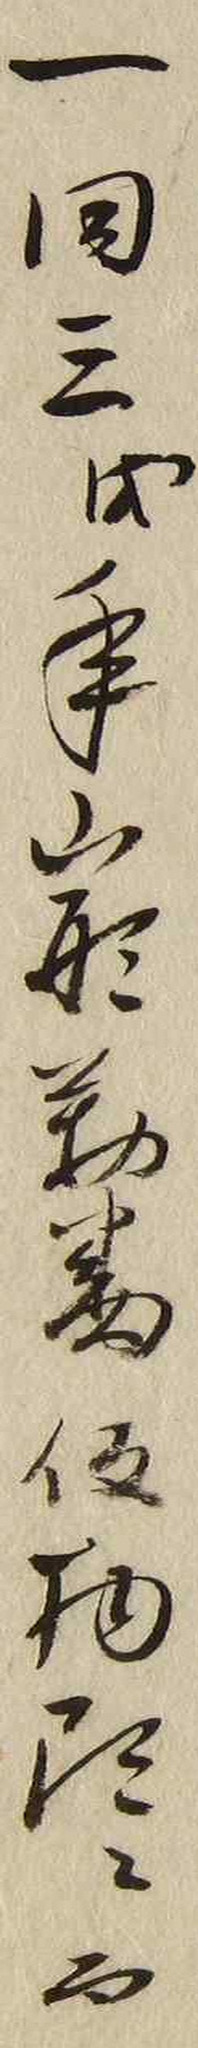一同三戌年山形勤番仮物頭ニ而

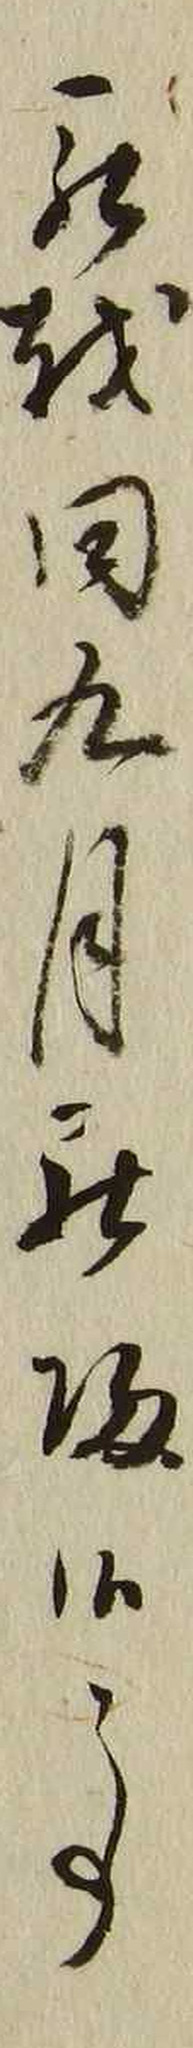罷越同九月罷帰候事
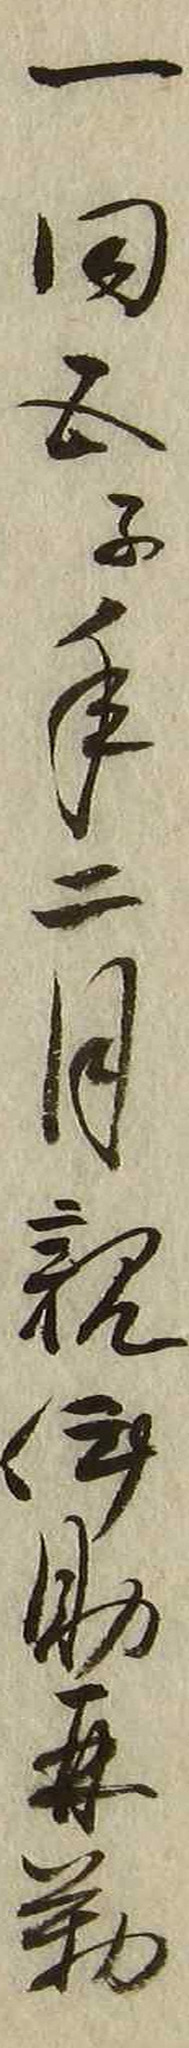一同五子年二月親伊助再勤
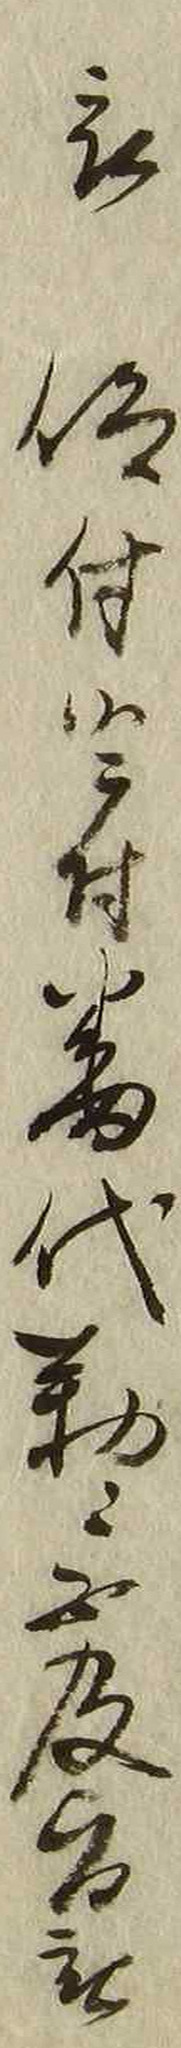被仰付候ニ付番代勤ニ不及旨被
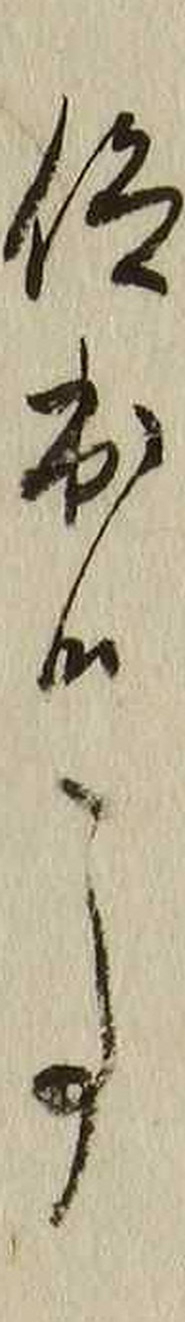仰出候事
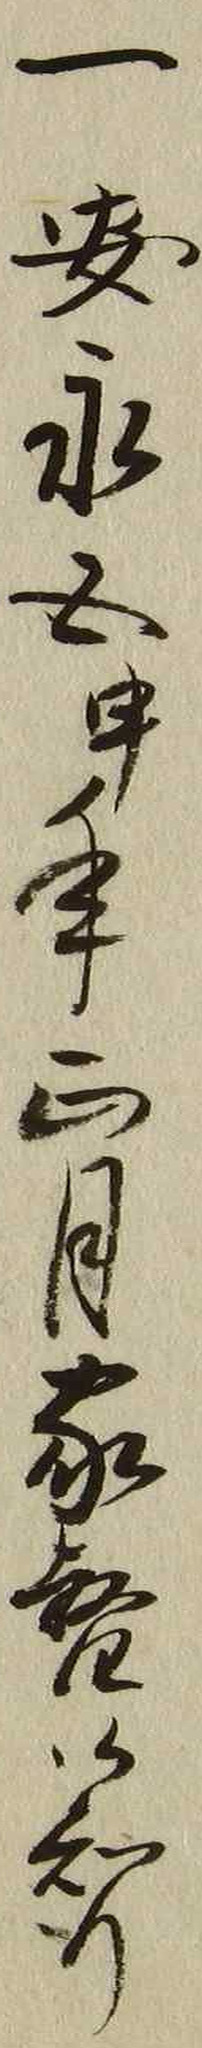一安永五申年正月家替御知行
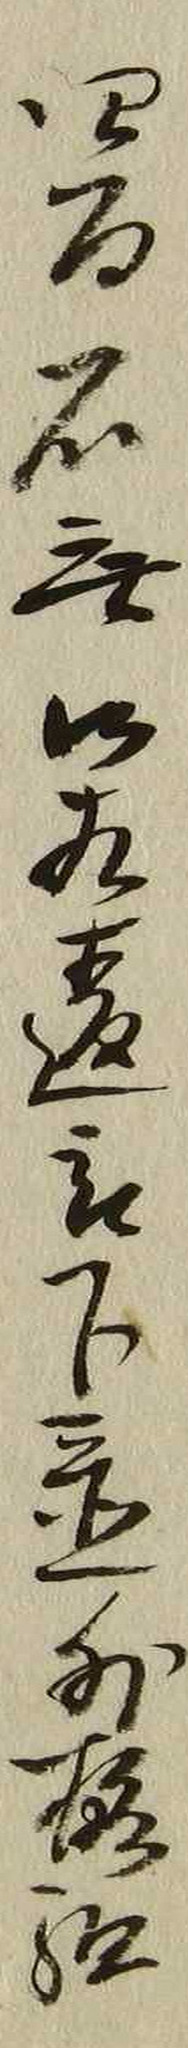四百石無御相違被下置外様組
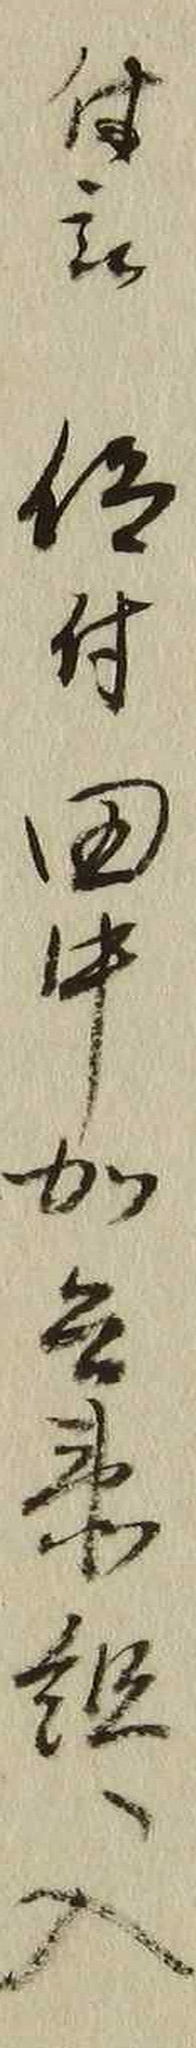付被仰付田中加兵衛組へ入
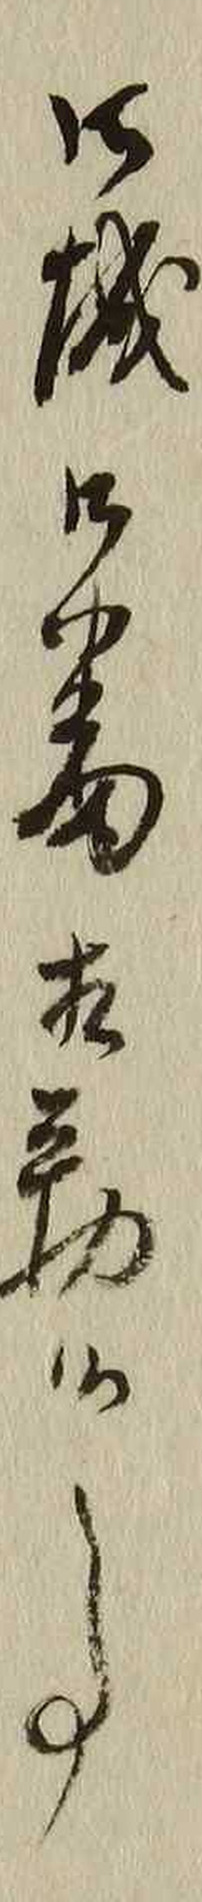御城御番相勤候事
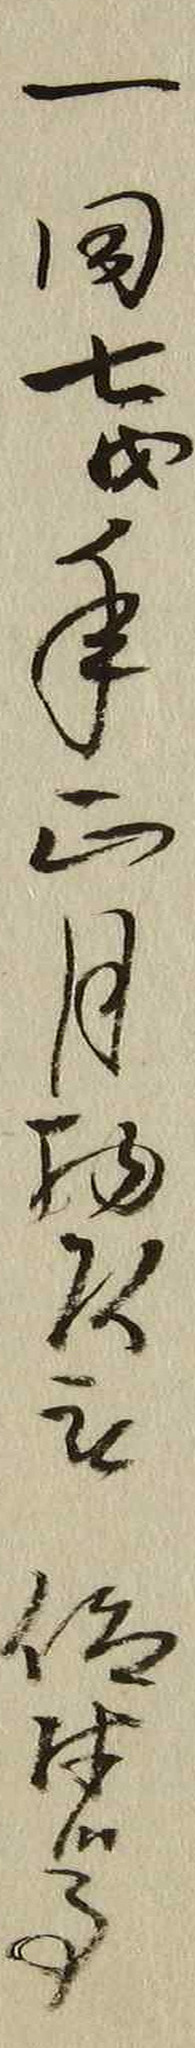一同七戌年正月物頭被仰付候事
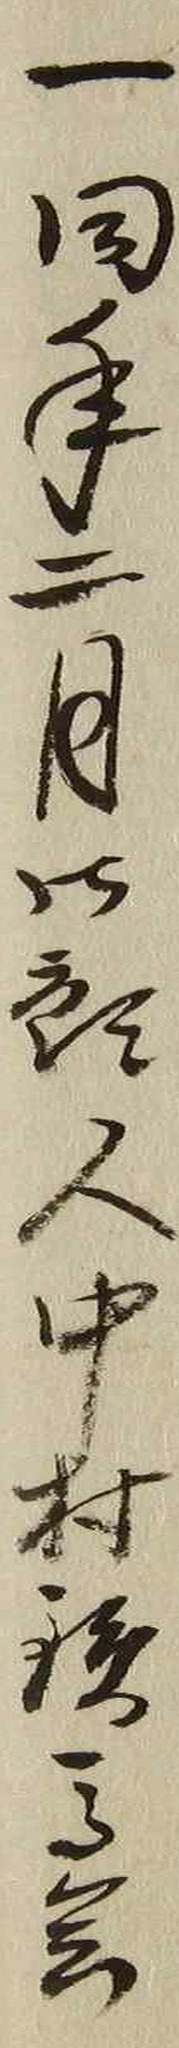一同年二月御預人中村鉄馬会
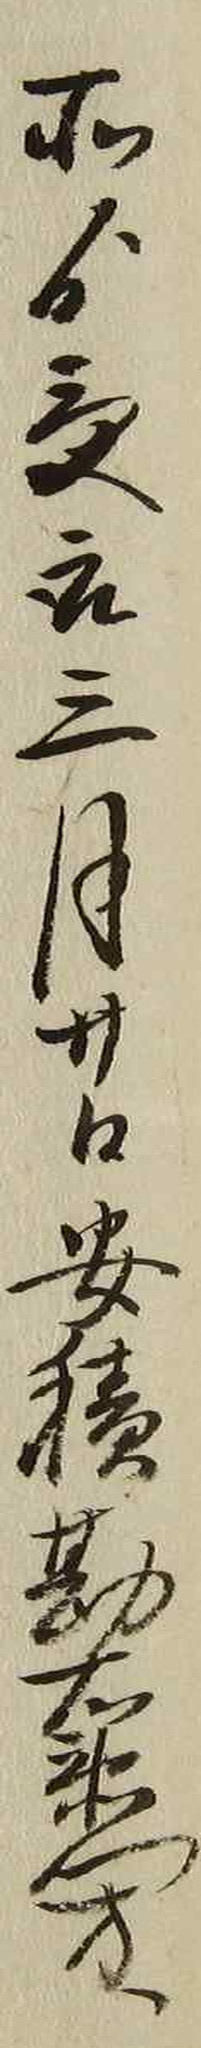所ゟ受取三月廿日安積勘右衛門方へ
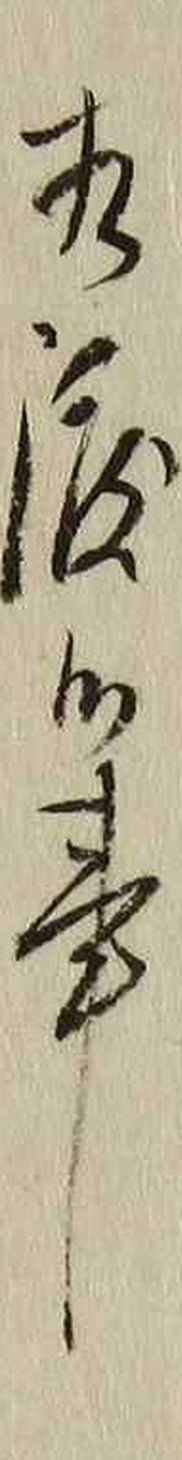相渡候事
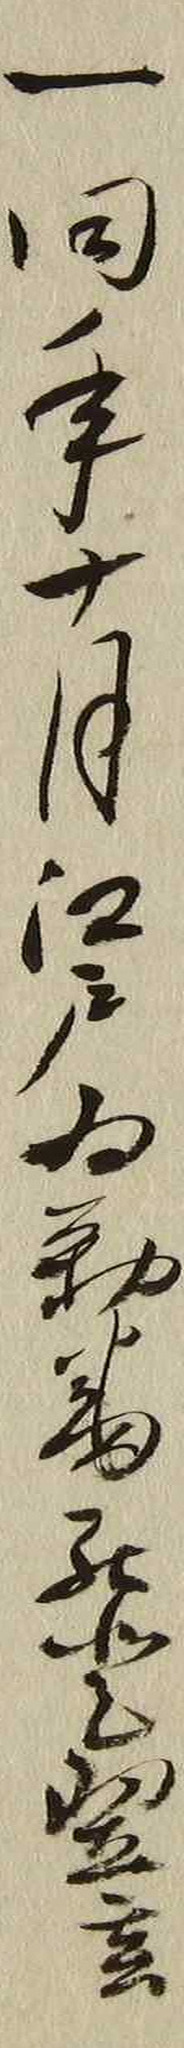一同年十月江戸為勤番罷登翌亥
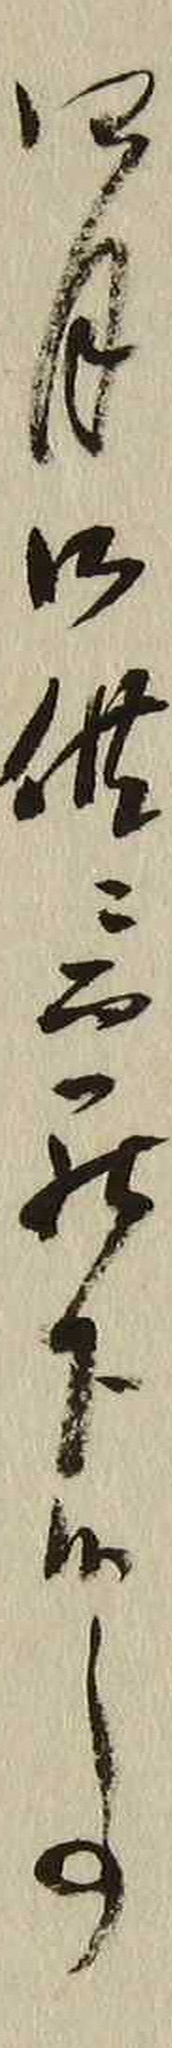四月御供ニ而罷下候事
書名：諸士系譜　巻之351　す之部1
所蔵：会津若松市立会津図書館
